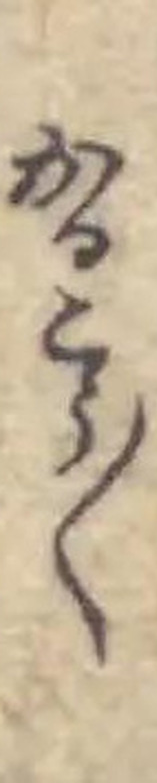かるこう〳〵
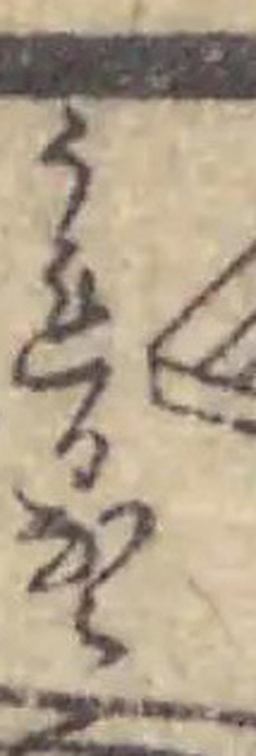うれるなら
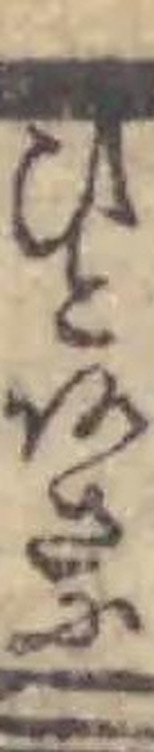ひとあさに
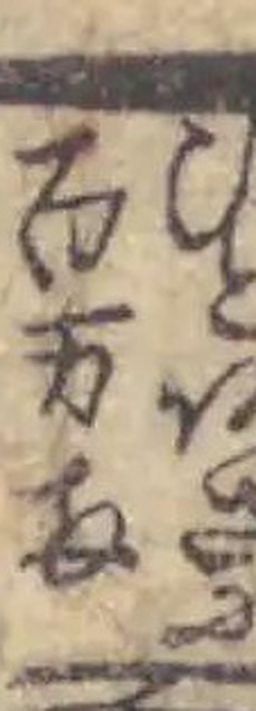百万両
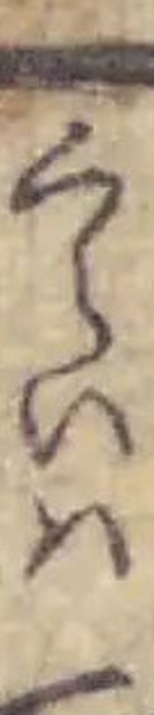くらいハ
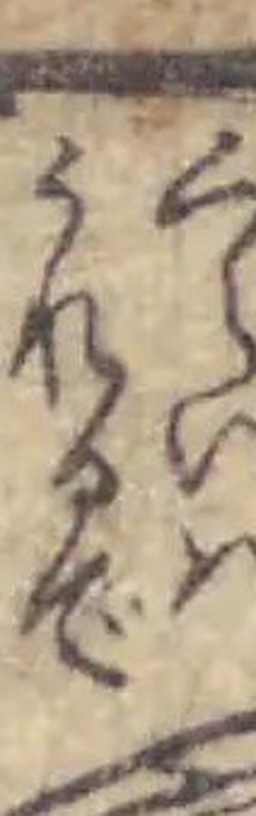うれるで
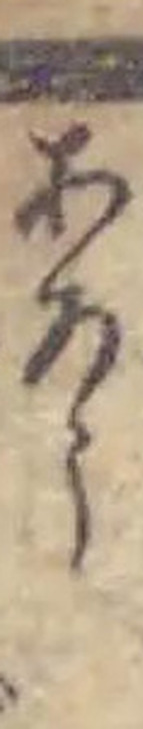あろう
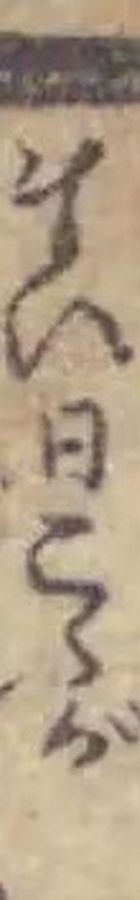まい日こゝが
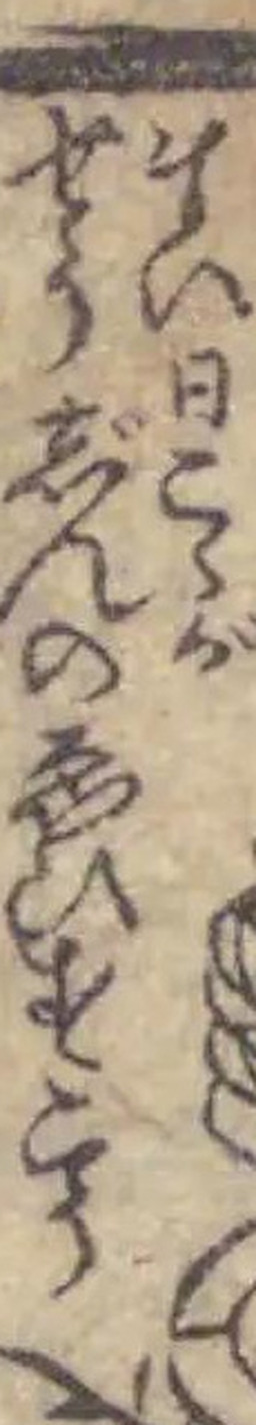せうじんのゑひすこう
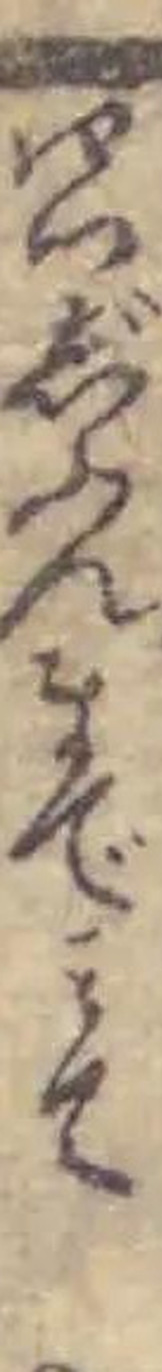四つじふんまでミて
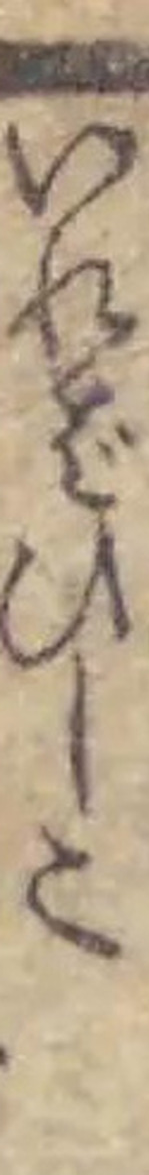いればひしこ
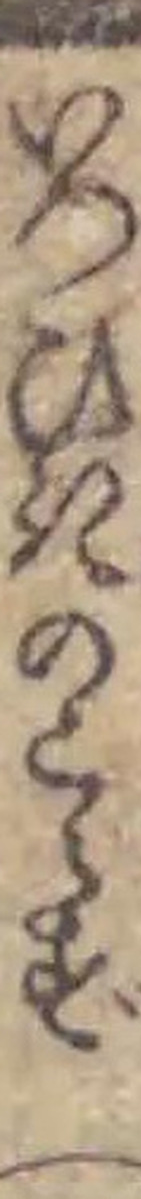いつひきのこらず
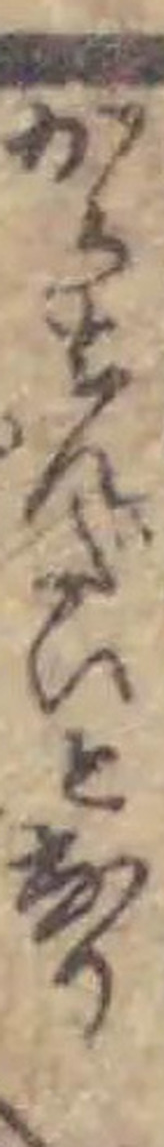からはんだいとなり
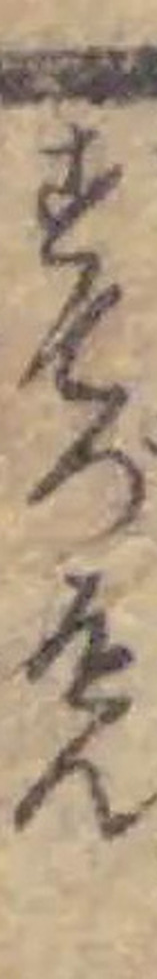すてづへん
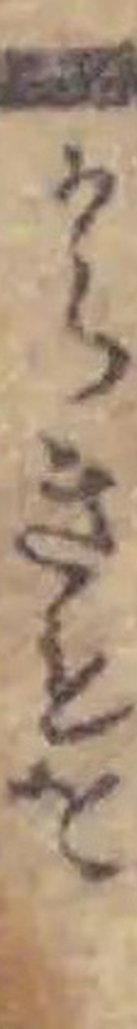からきもを

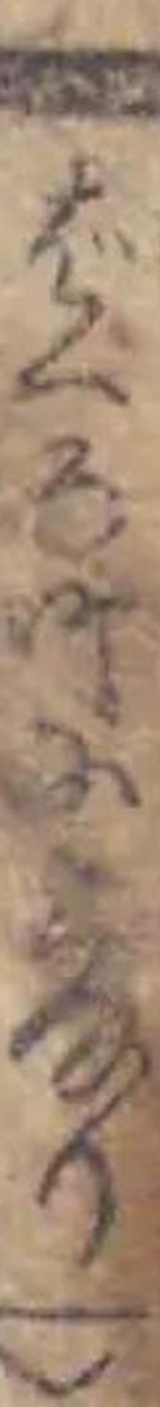ばくろ町に立なり
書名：豆男江戸見物 2巻
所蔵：国立国会図書館 National Diet Library, JAPAN
